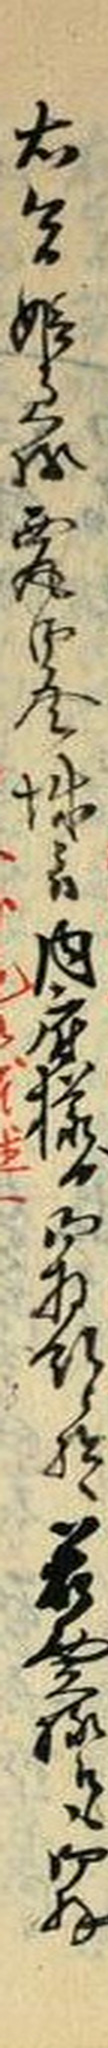右今日姫君様西丸御登城ニ付内府様ゟ御拝領被遊候若殿様江も御拝
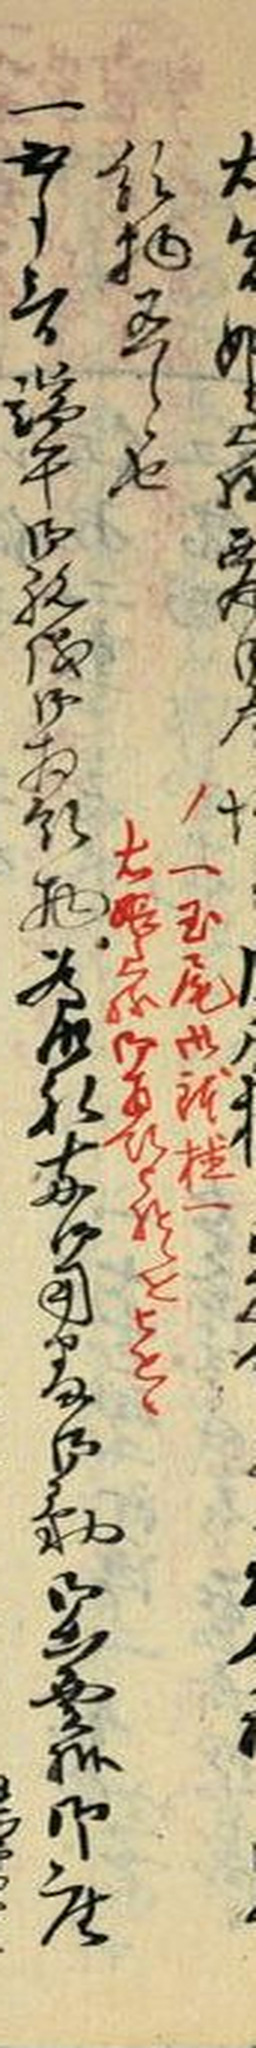一五月三日端午御祝儀御拝領物為御礼両御用番御勤御出殿掛御座
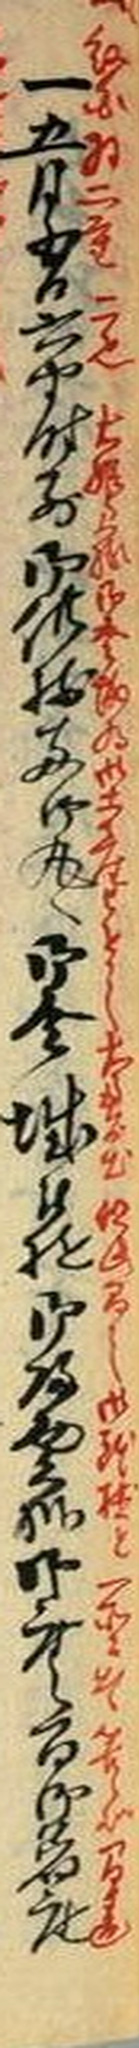一五月五日六半時前御供揃両御丸へ御登城被遊御帰殿掛御座之間御着座
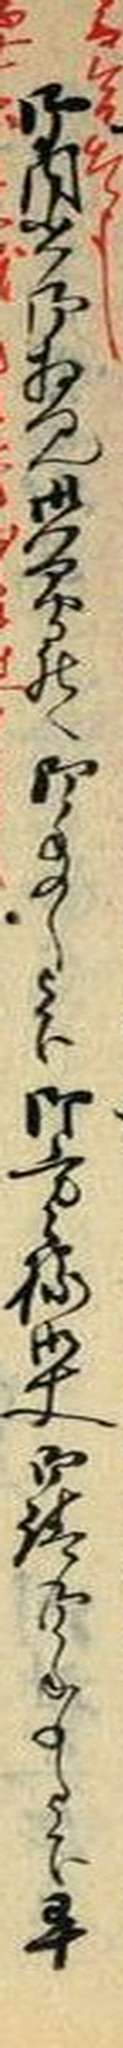御内書御拝見御留守居へ御手のし被下御方々様御使御請御手のし被下畢
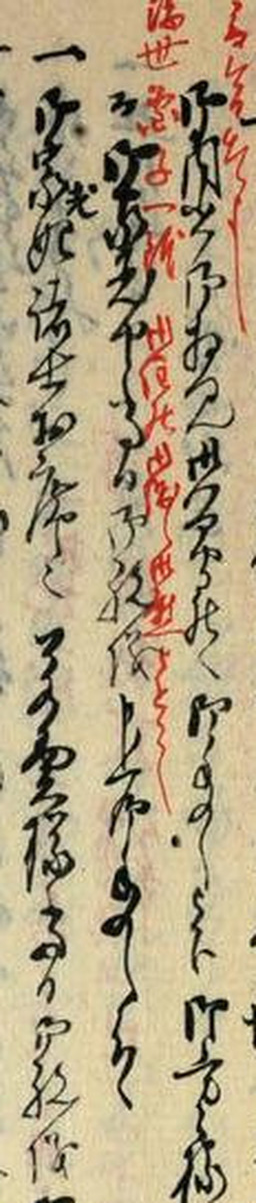而御家老中当日御祝儀申上御手のし被下候
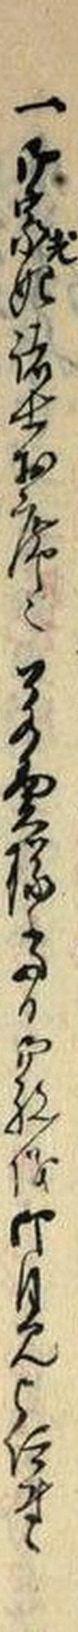一御家老始諸士於席々若殿様当日御祝儀御目見被仰付候
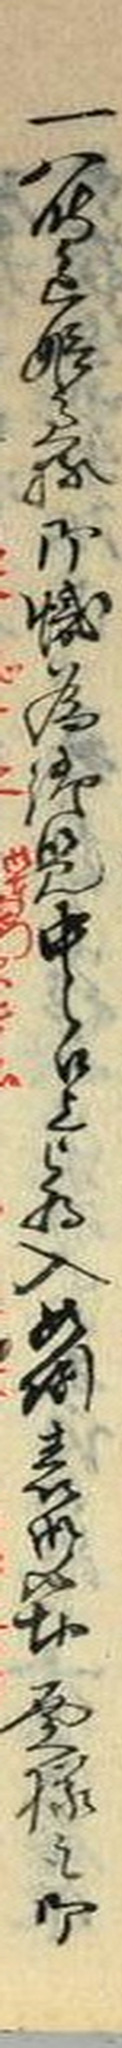一八時過姫君様御幟為御覧中之口迄被為入如例表御〆切殿様ニも御
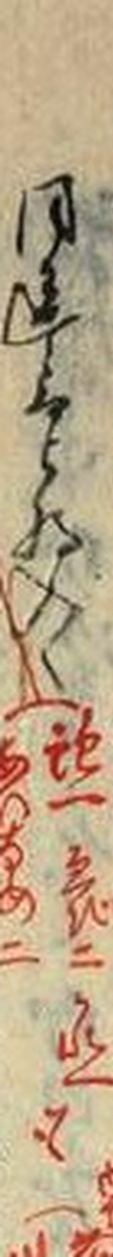同道ニ而被為入候
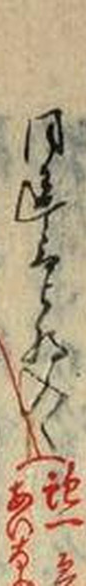同道ニ而被為入候
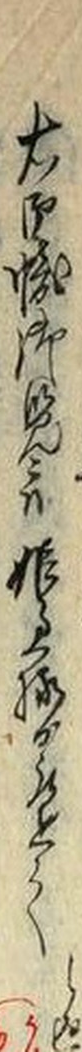右御幟御覧ニ付姫君様ゟ被進之
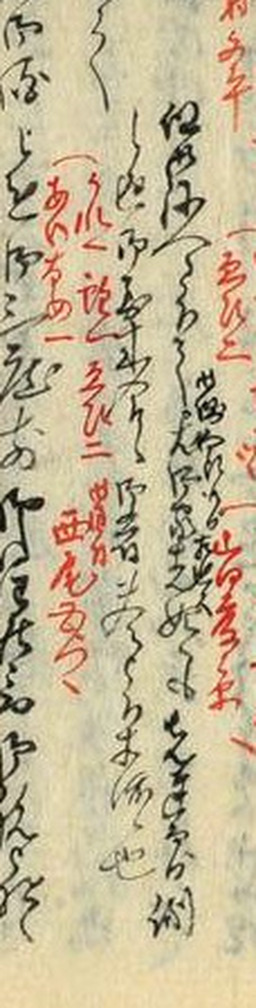之通御到来合候御肴夫々被下相済候也
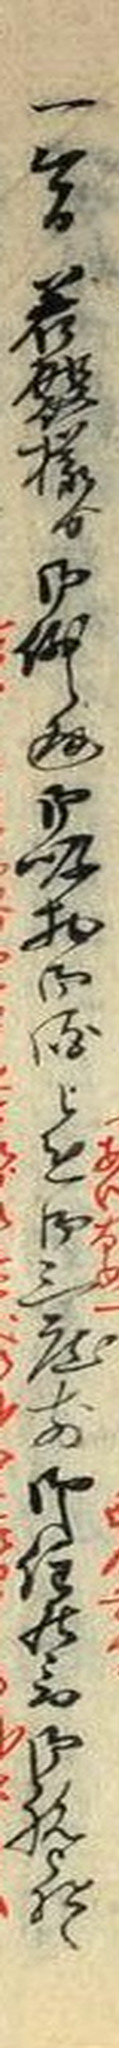一今日若殿様ゟ御例之通御吸物御酒被進御三度前御住居ニ而御祝被遊候
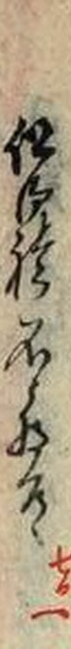但御袴不為召候
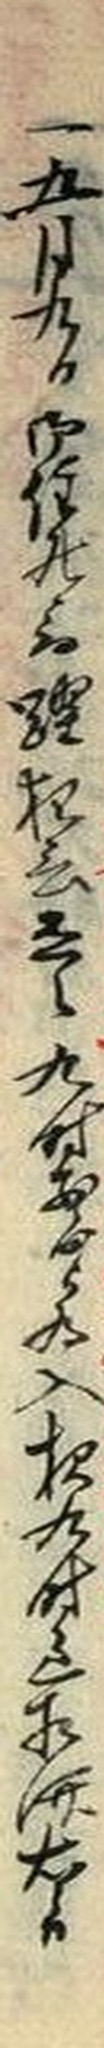一五月九日御住居ニ而躍狂言有之九時前ゟ被為入夜九時過相済右ニ付
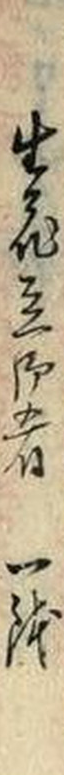生花立御肴一鉢
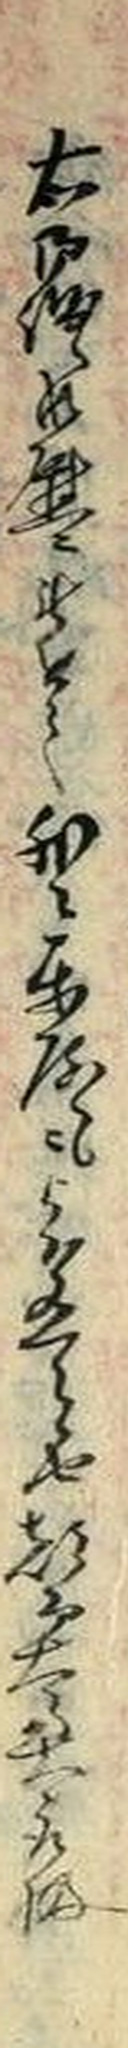右御側へ御慰ニ被進之外ニ楽屋へも被下有之候由都而大奥取扱
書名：少傅日録抄（斉承付側向頭取日記、在府）
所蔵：福井県文書館 Fukui Prefectural Archives
